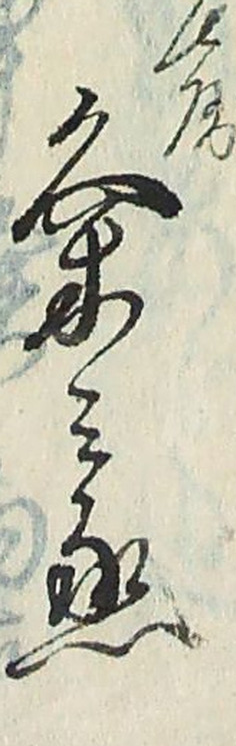粂之丞
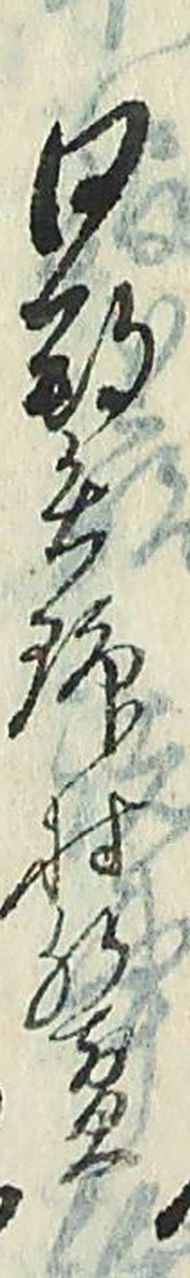同郡矢野村肝煎
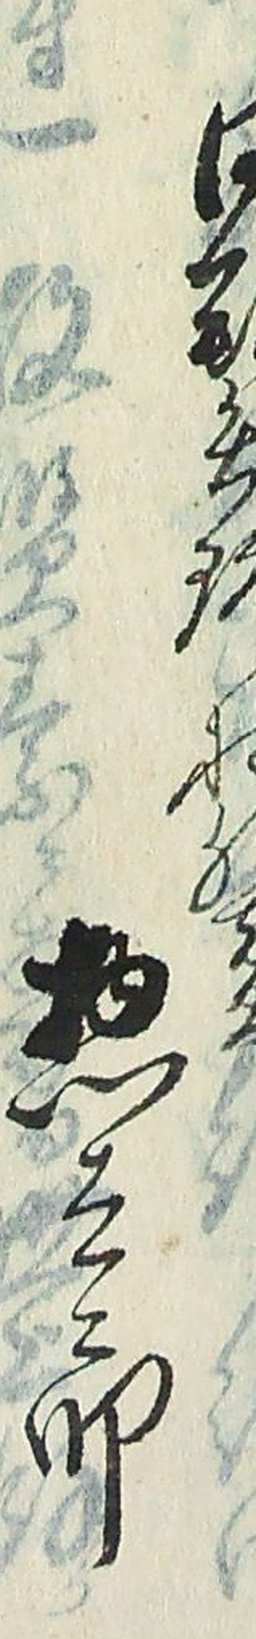惣太郎
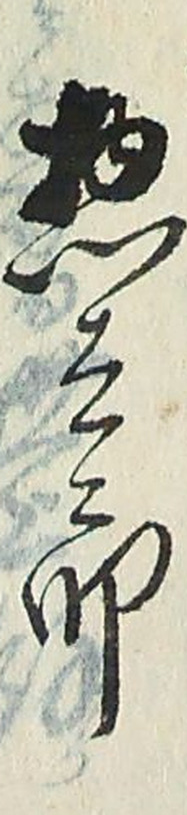惣太郎
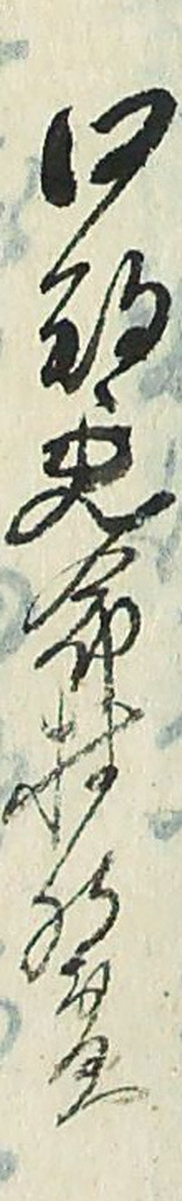同郡延命村肝煎
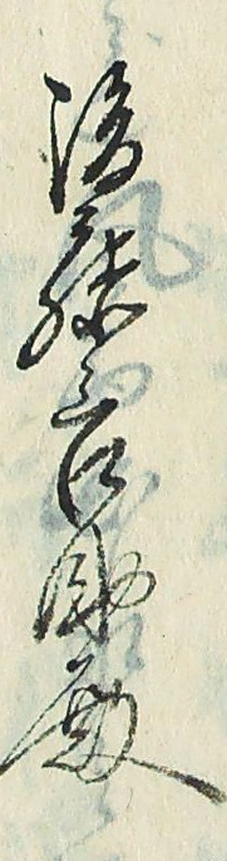後藤善助殿
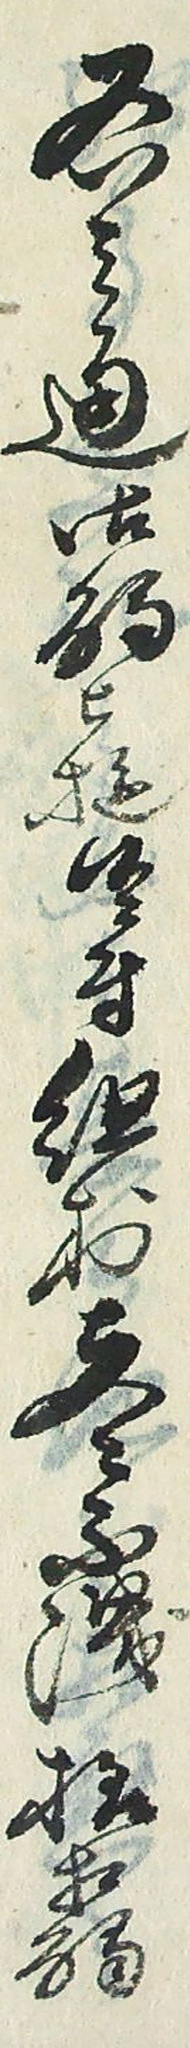右之通御触被遊候に付組村夫々不洩様相触
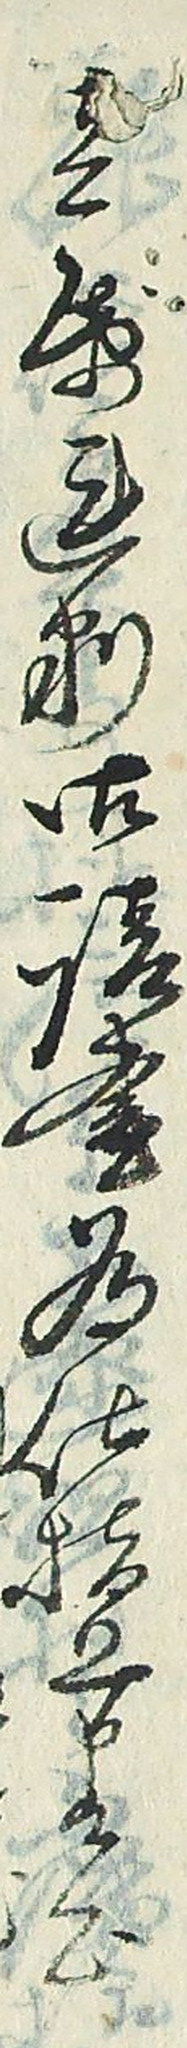壱帋連判御請書為仕指上申候以上
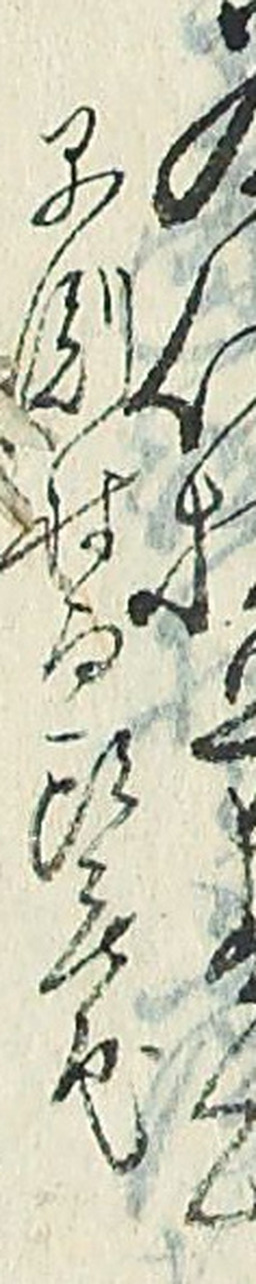早渕村与頭庄屋
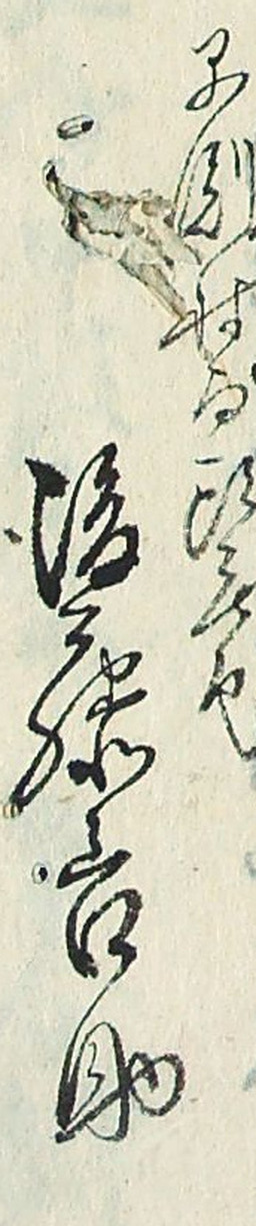後藤善助
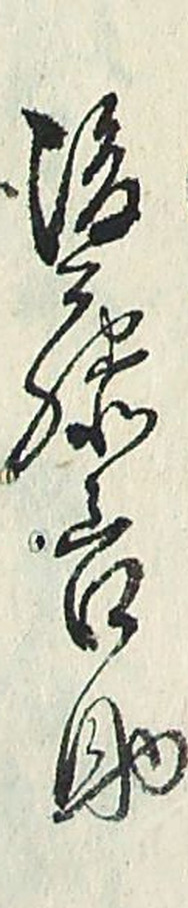後藤善助

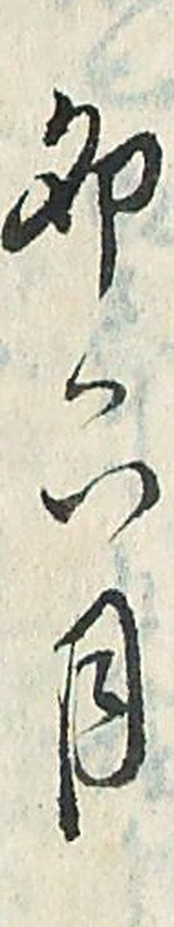卯六月
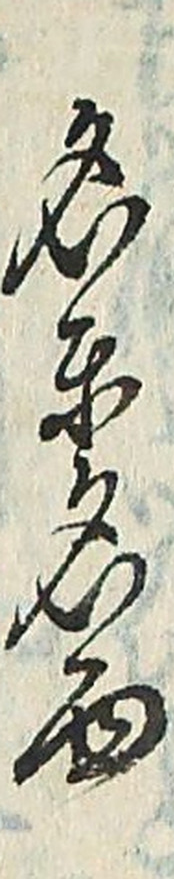名東名西
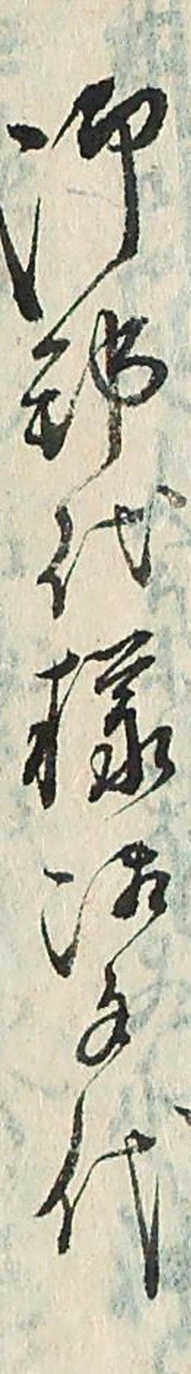御郡代様御手代
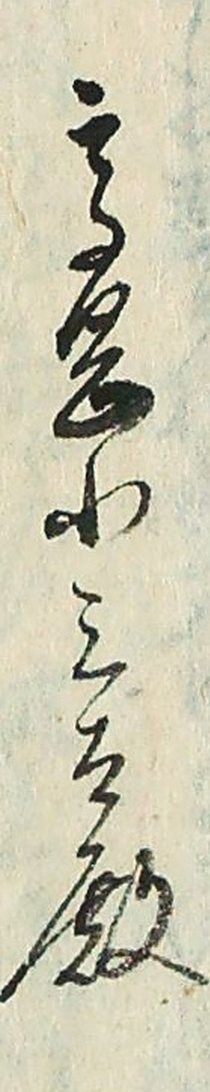高岡小三太殿
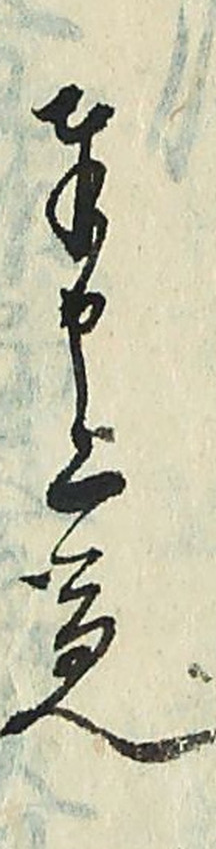奉申上覚
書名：諸御用御□受書控
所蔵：鳴門教育大学 Naruto University of Education
